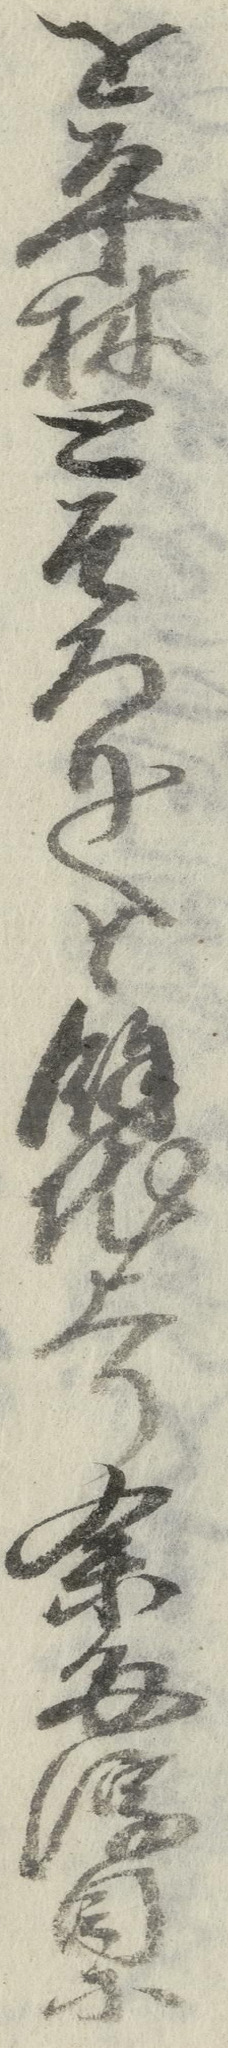を平林とそろり〳〵と餘地上り余毎浮目に
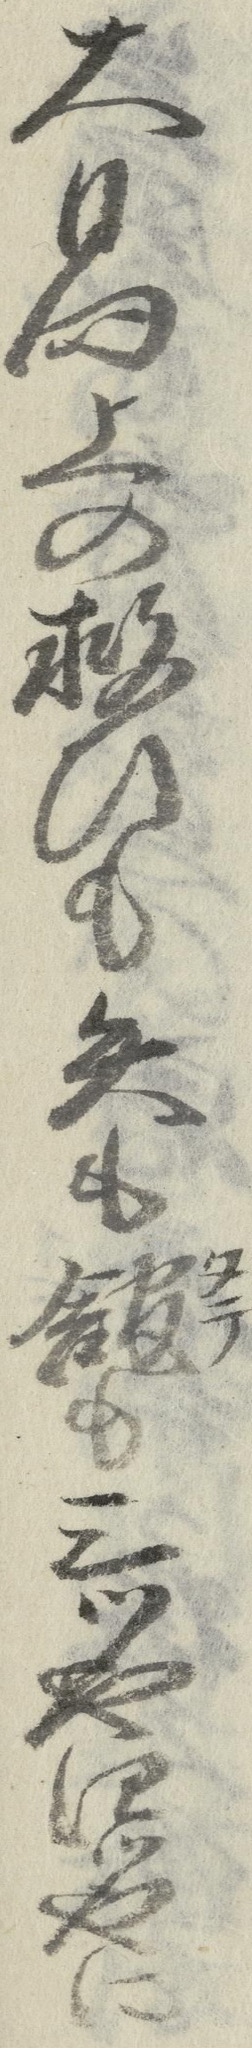大日向上の救ひも矢も舘も三ツや四ツやに
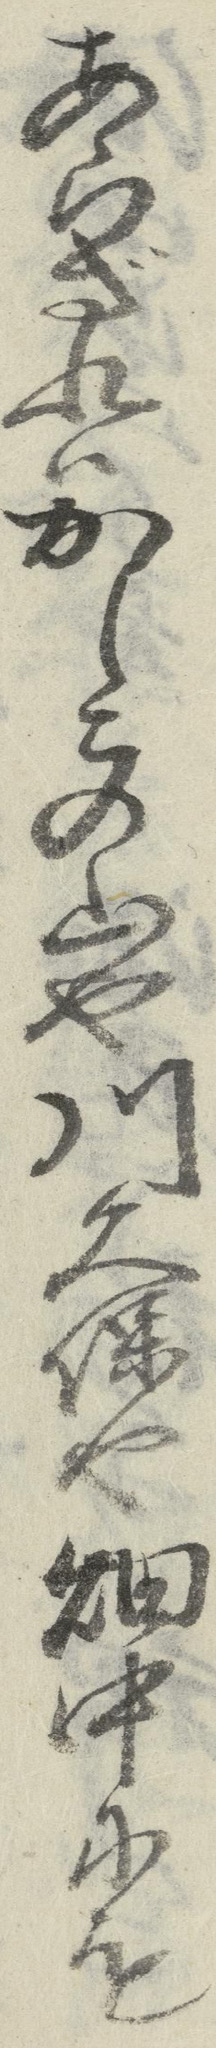あらざれはかしこの山や川久保や畑中にも
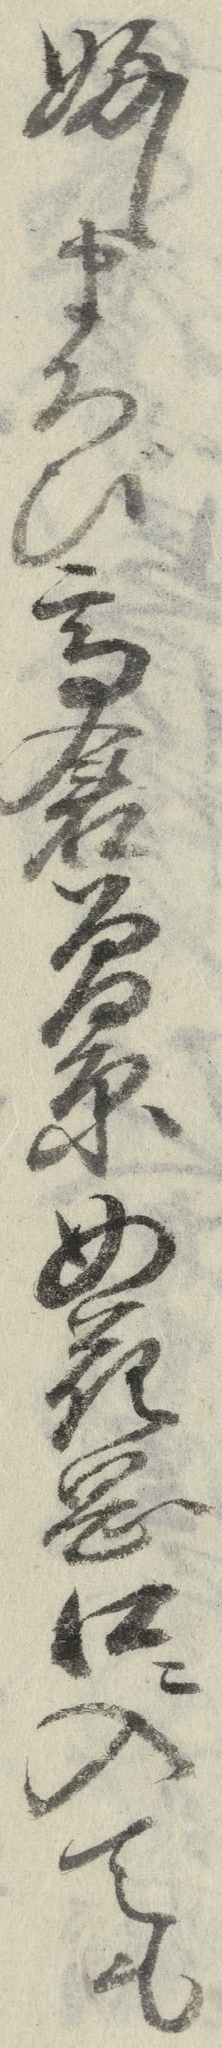ふしまろび高倉曽原め花岡口に入ても
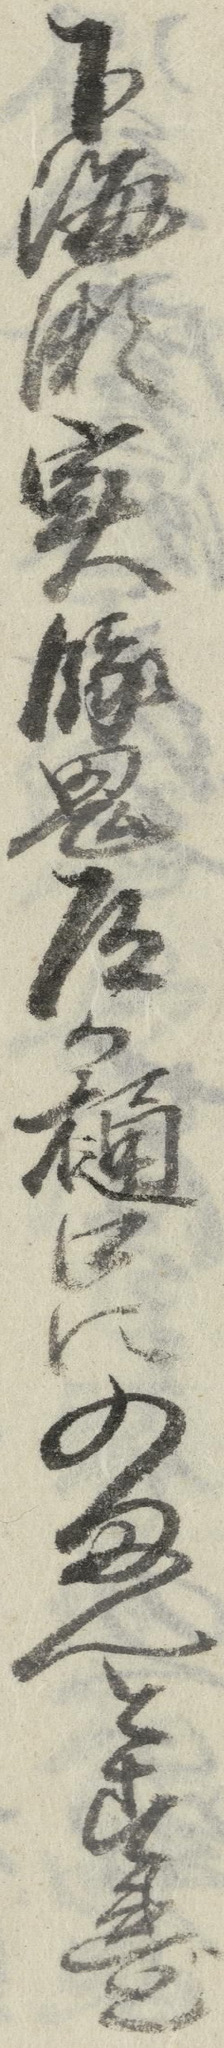下海瀬実餓鬼道か樋口にのまんとすれど
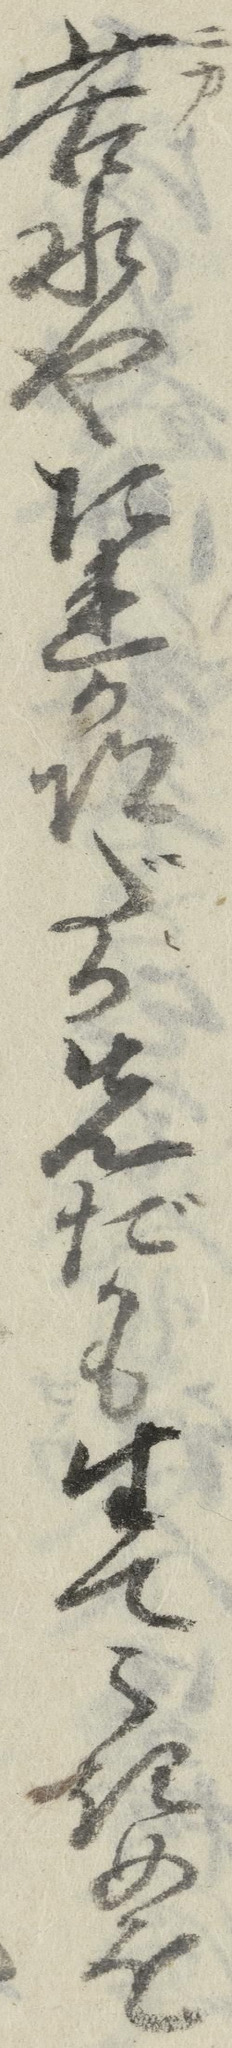苦水やたれの跡だか先だかも生てうきめを
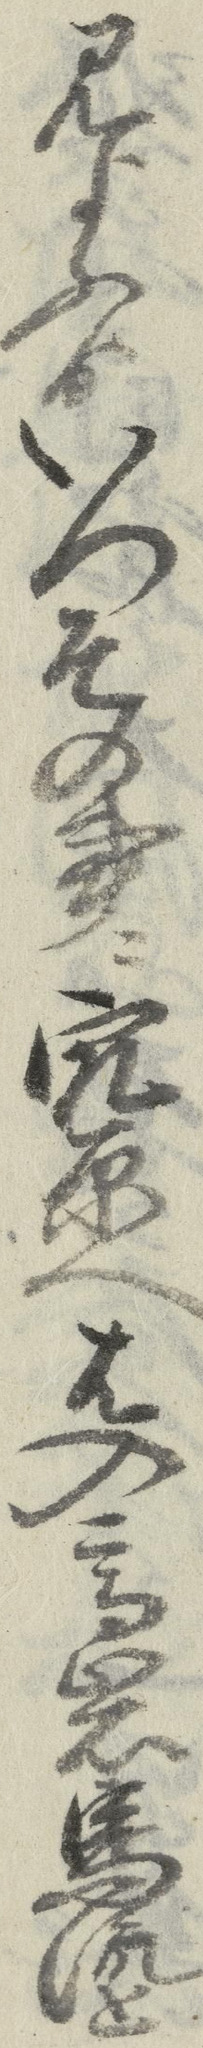見よふゟいつその事に穴原へは入高岩馬流と
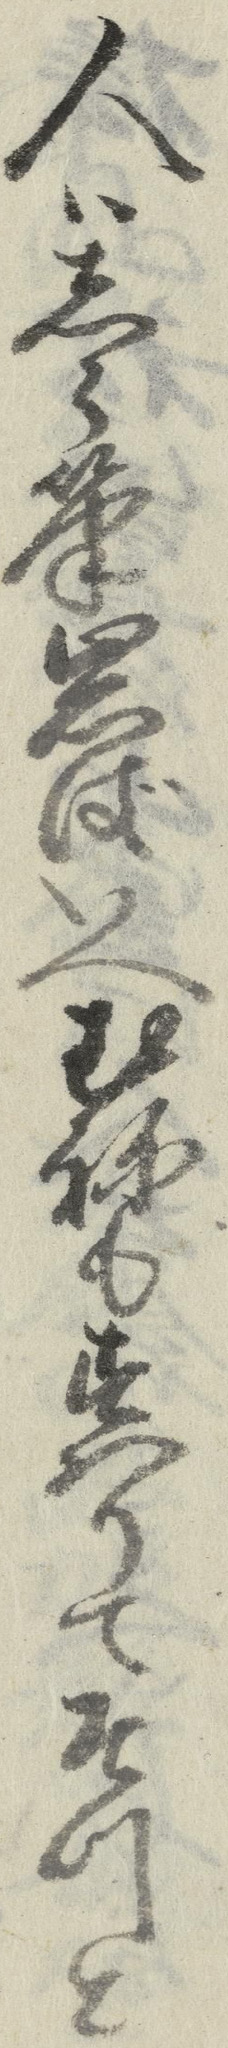人はしら筆岩ばいへむねもすはりてそつと
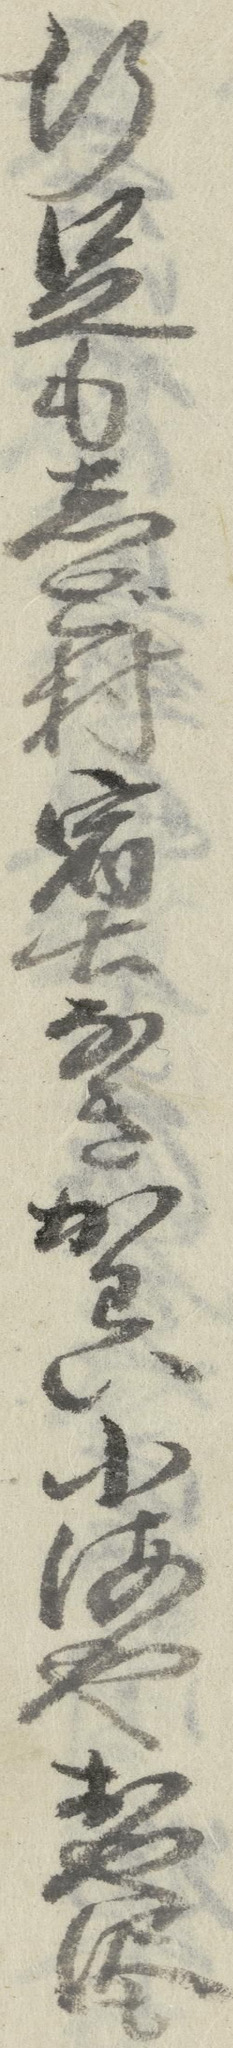行足もしど村宥士なきかわい小海やおや沢も
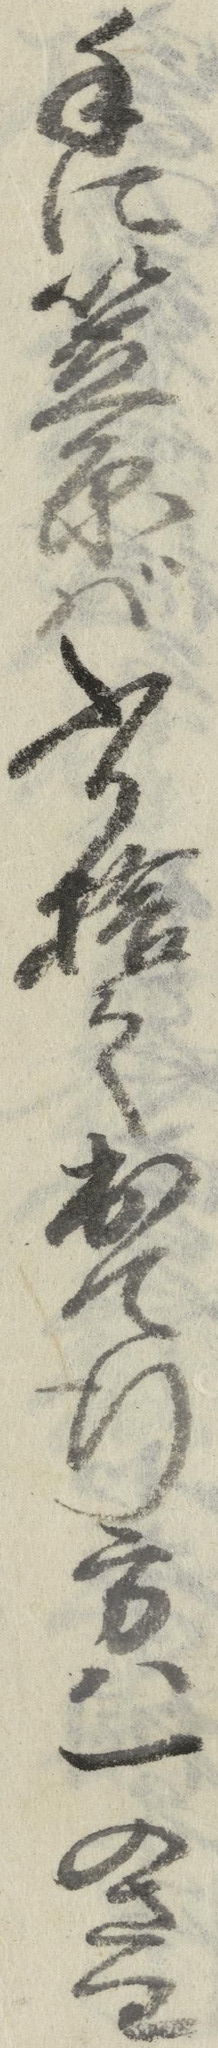手に笠原ばふり捨て出て行方は一のさわ

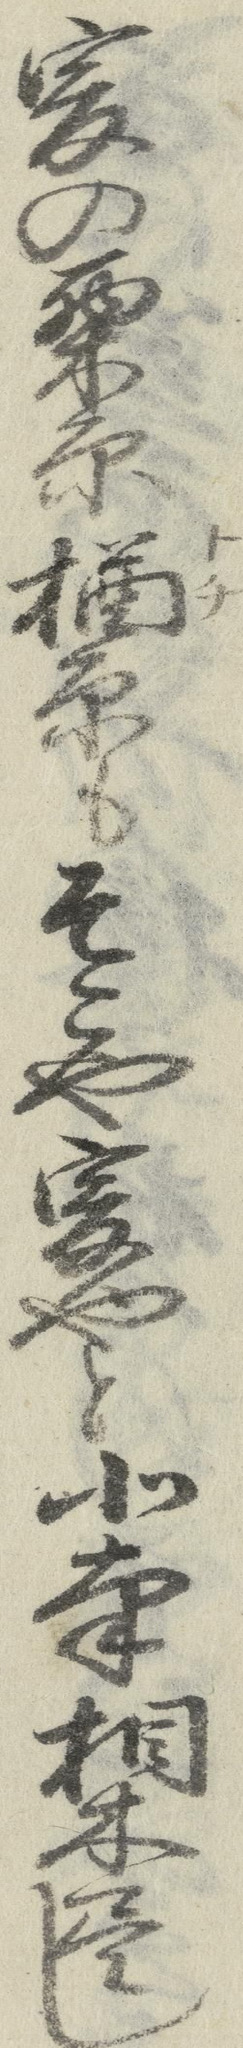爰の栗原楢原もそこや爰やと北南相木尽し
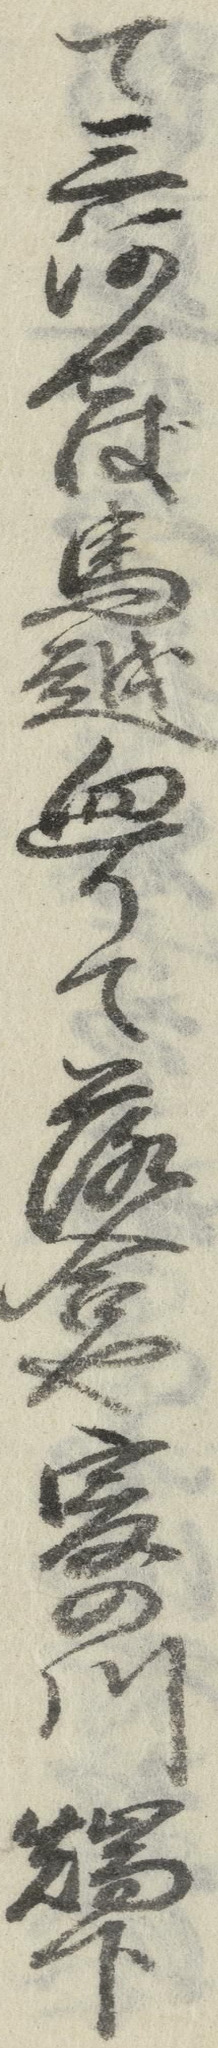て三河せば馬越廻りて落合や爰の川端下
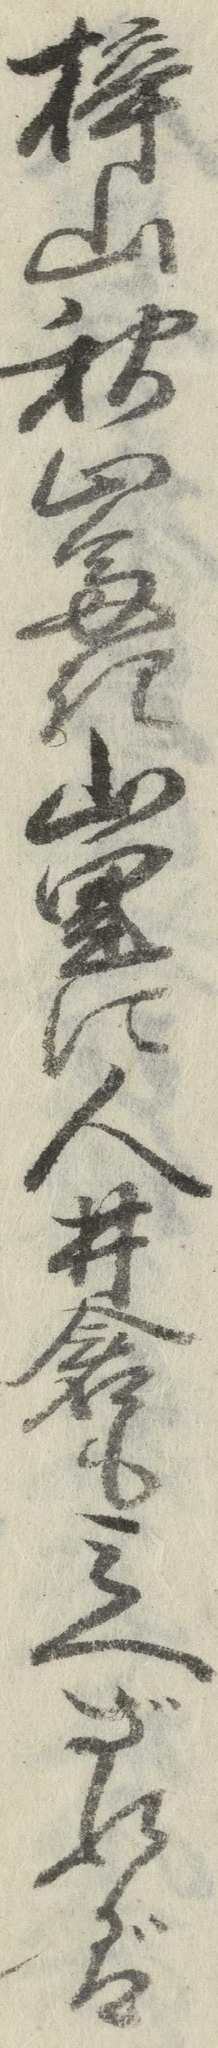梓山秋山富き山里に人井倉もみへざれば
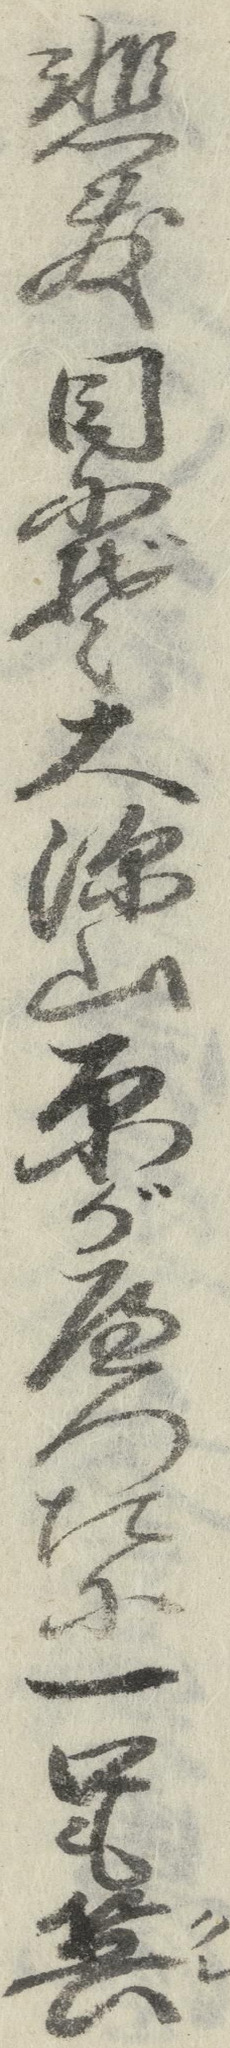悲敷目にぞ大深山原がへつたに一口も呉
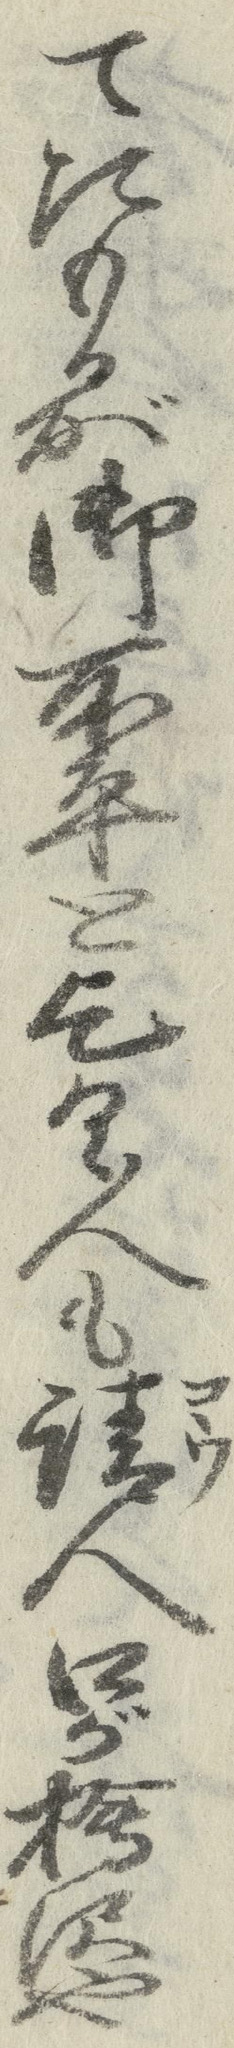てたもるが御所平と乞るゝ人も請人口が檜沢や
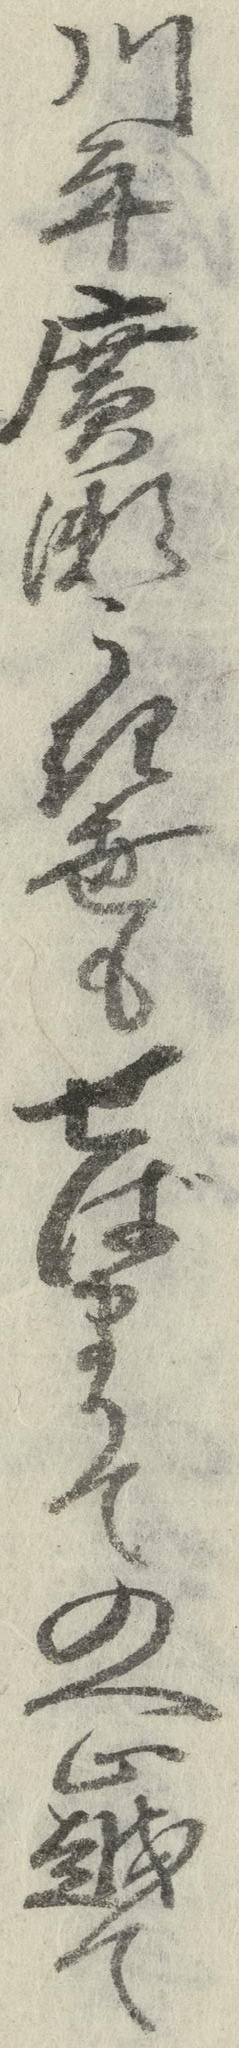川平広瀬うき世もせばまりてのへ山越て
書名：浅間大焼騒動記　中
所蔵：東京大学地震研究所図書室 Earthquake Research Institute Library, The University of Tokyo, JAPAN
